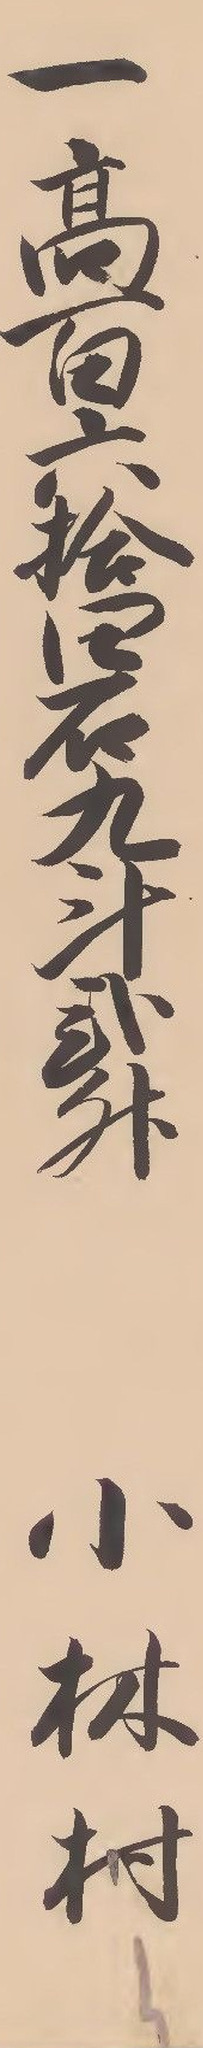一高百六拾四石九斗弐升小林村
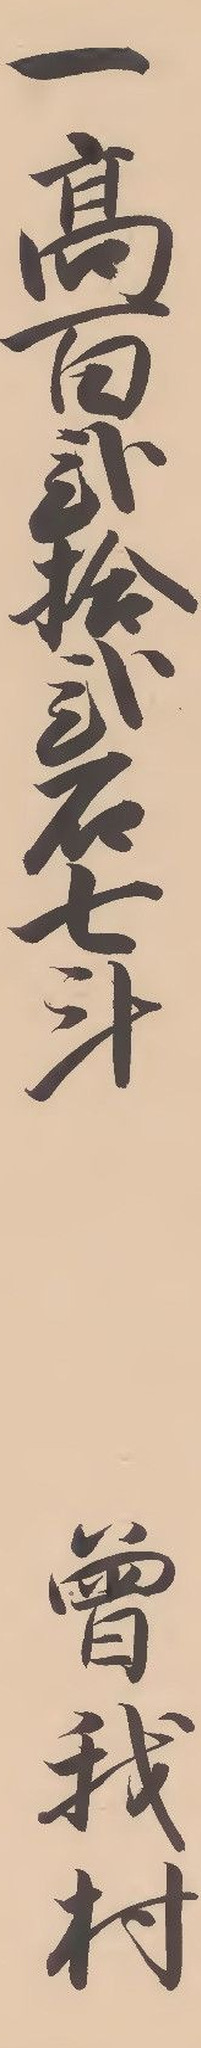一高百弐拾弐石七斗曽我村
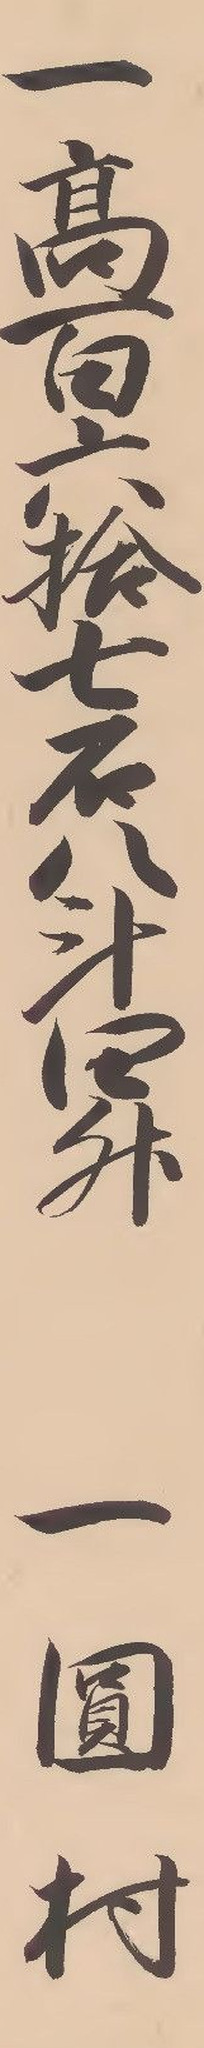一高百六拾七石八斗四升一円村
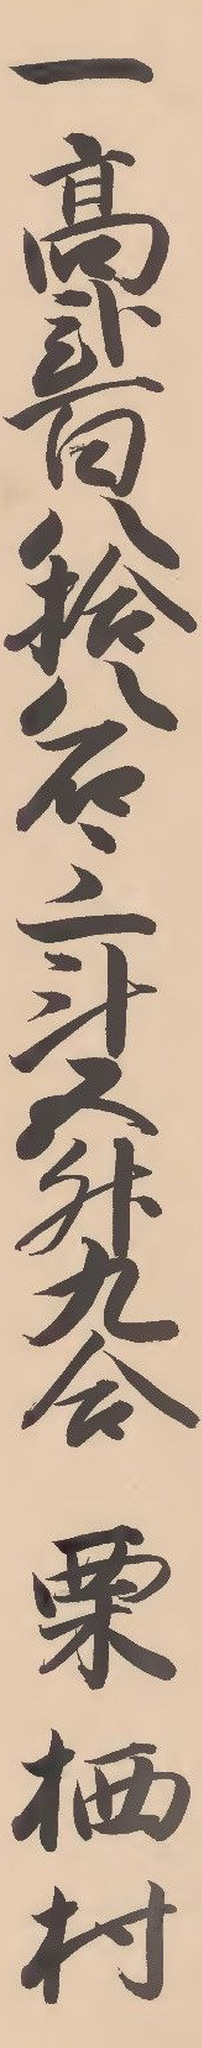一高弐百八拾八石三斗五升九合栗栖村
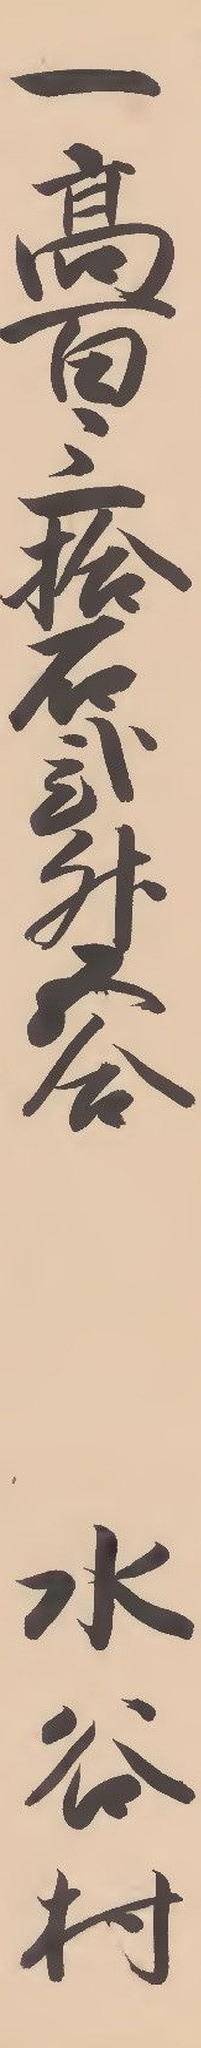一高百三拾石弐升五合水谷村
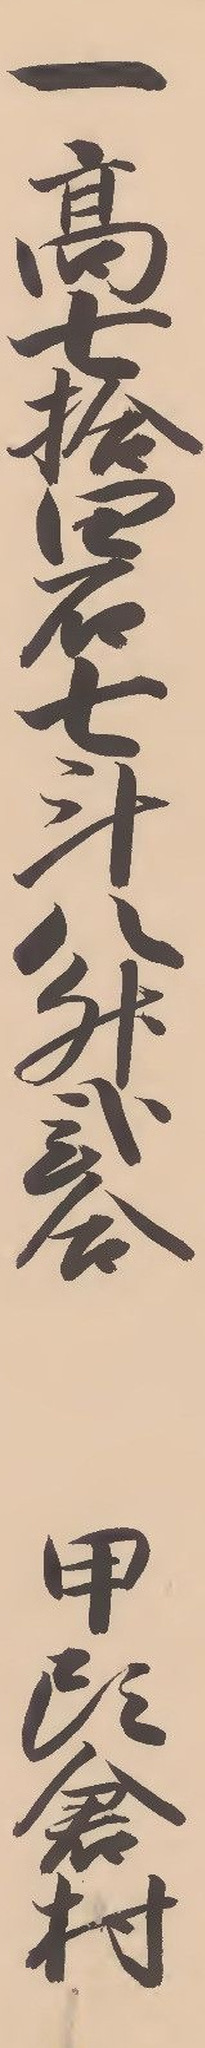一高七拾四石七斗八升弐合甲頭倉村
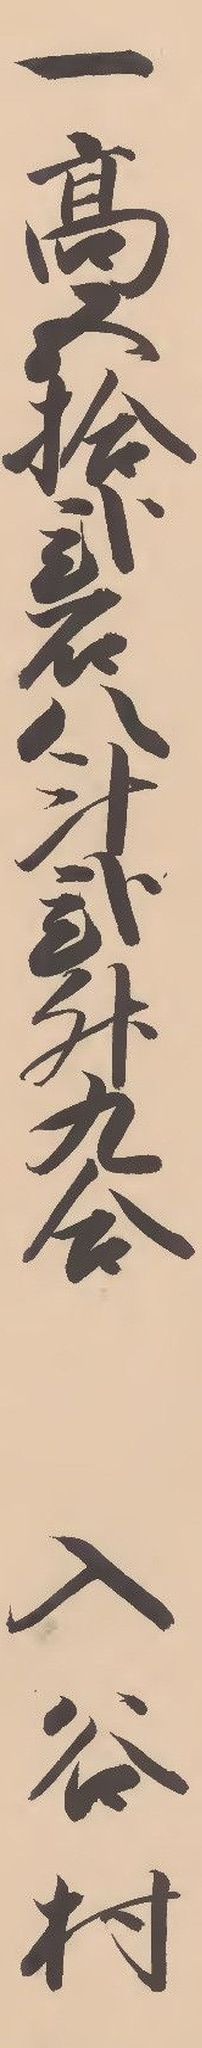一高五拾弐石八斗弐升九合入谷村

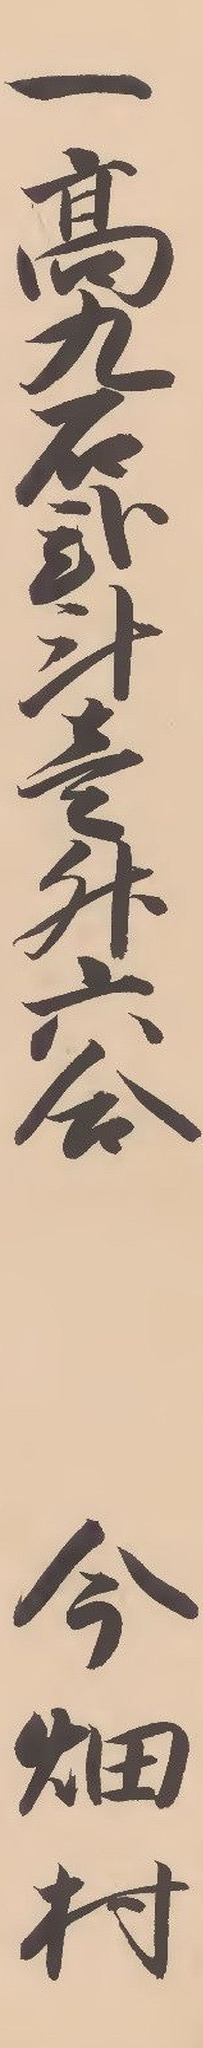一高九石弐斗壱升六合今畑村
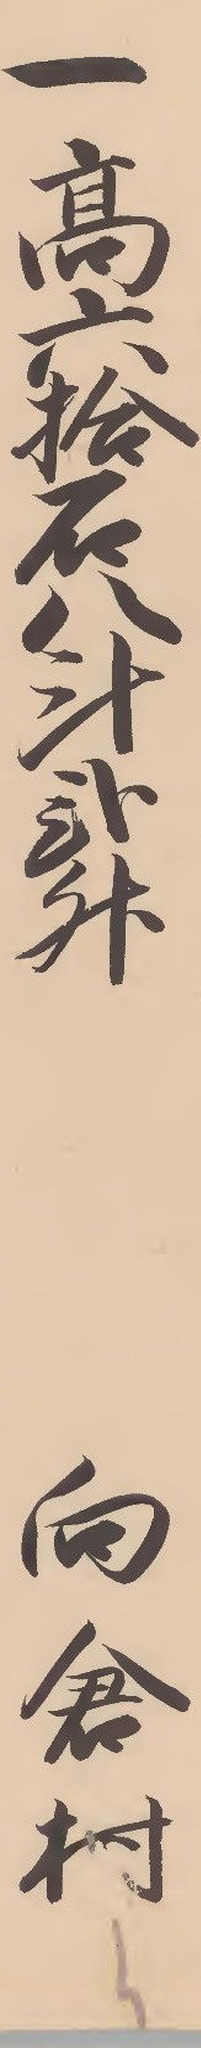一高六拾石八斗弐升向倉村
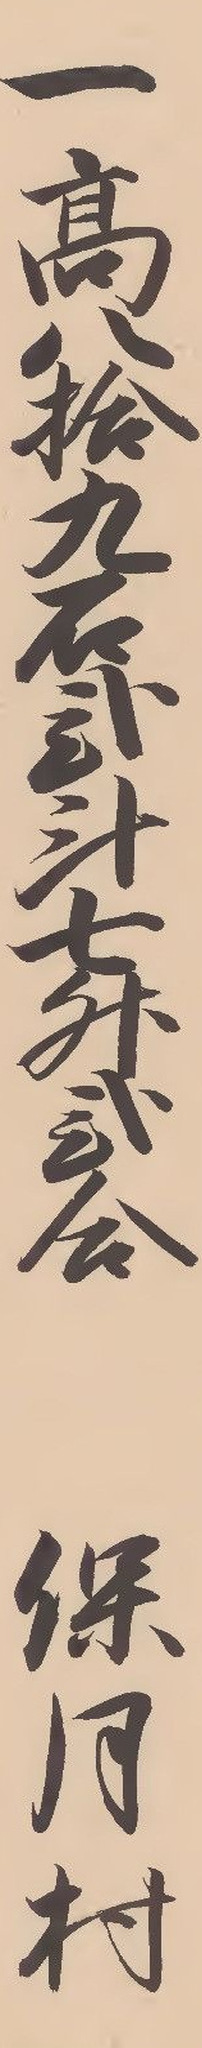一高八拾九石弐斗七升弐合保月村
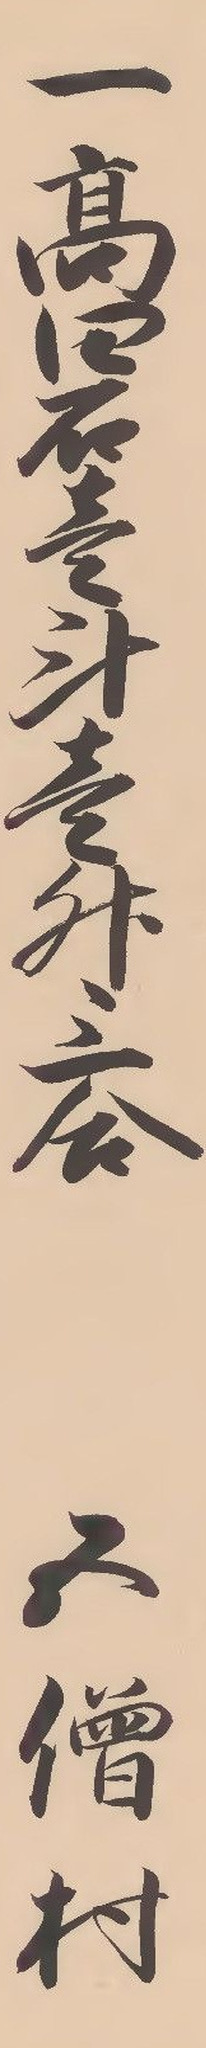一高四石壱斗壱升三合五僧村
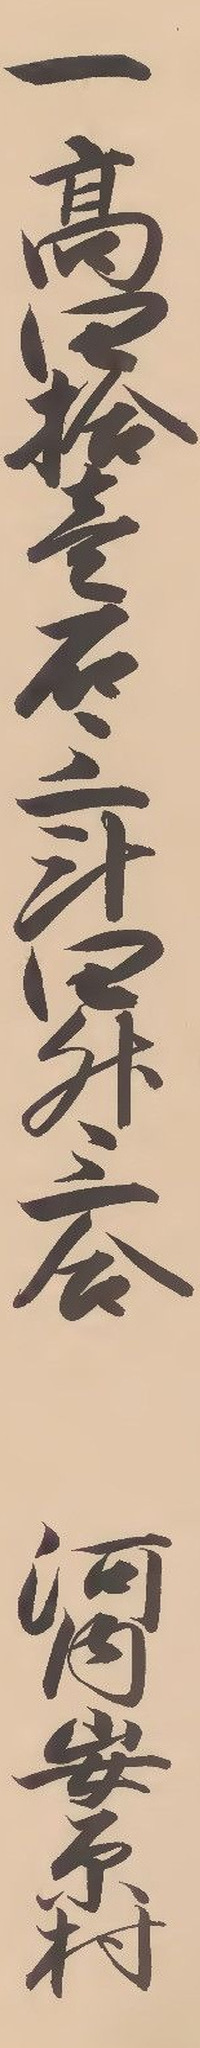一高四拾壱石三斗四升三合河内安原村
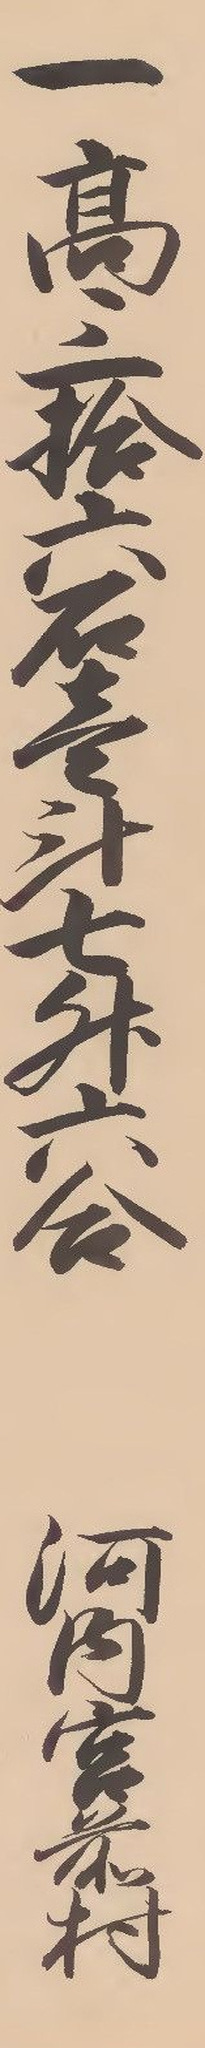一高三拾六石壱斗七升六合河内宮前村
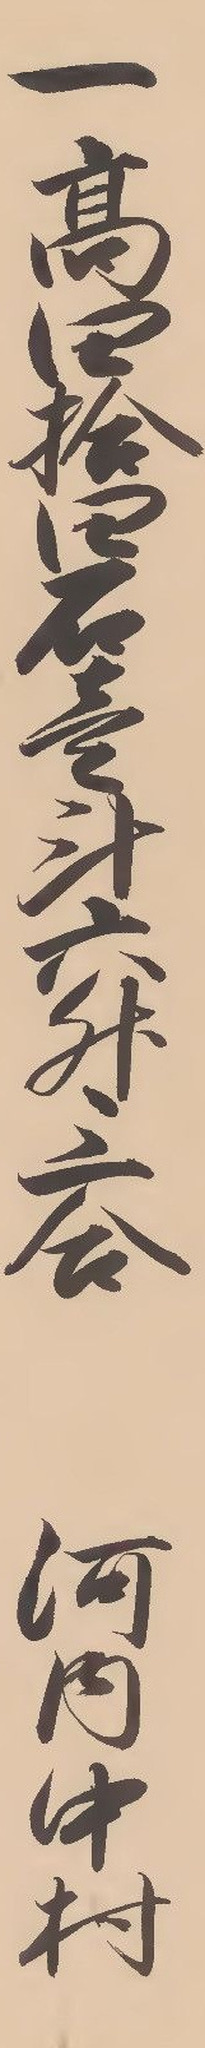一高四拾四石壱斗六升三合河内中村
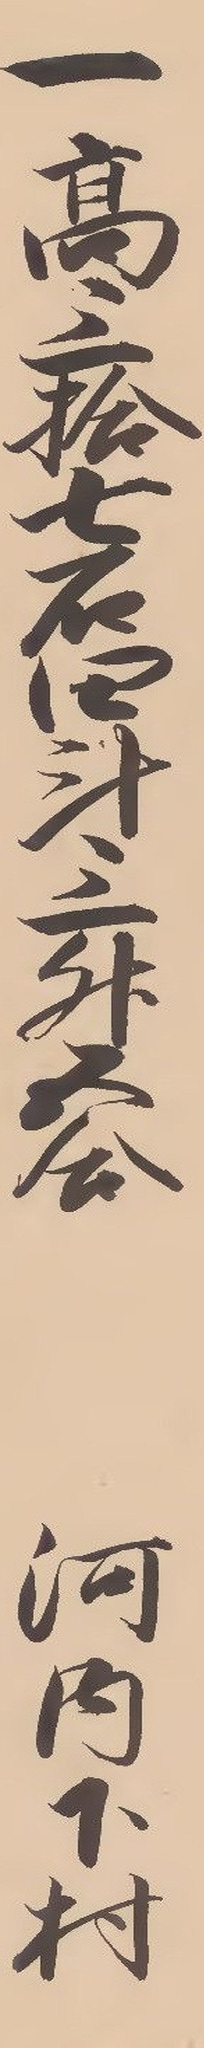一高三拾七石四斗三升五合河内下村

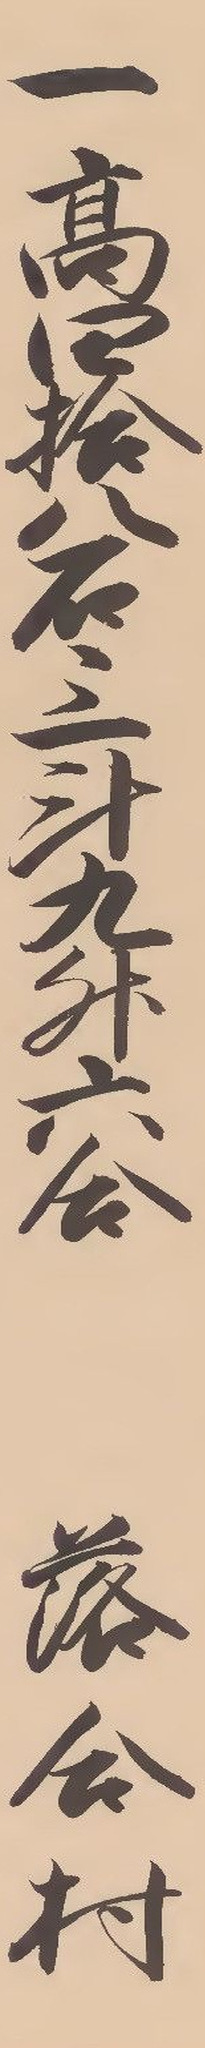一高四拾八石三斗九升六合落合村
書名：近江国郷帳
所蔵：国立公文書館 National Archives of Japan
